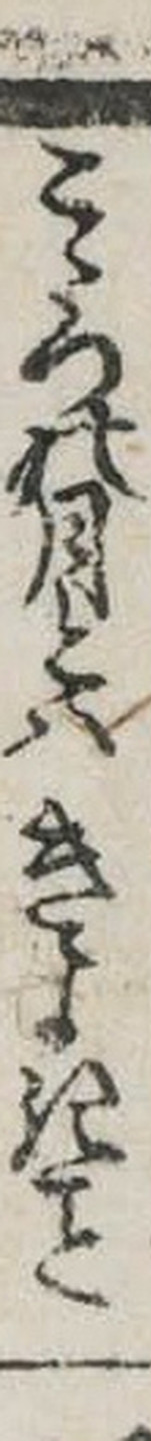こゝろの月とはきよきこと
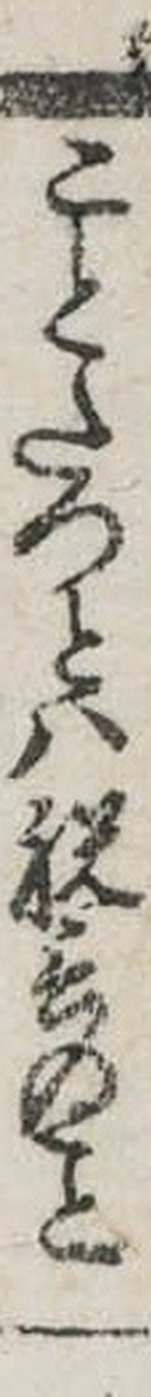ことたつとは祝言のこと
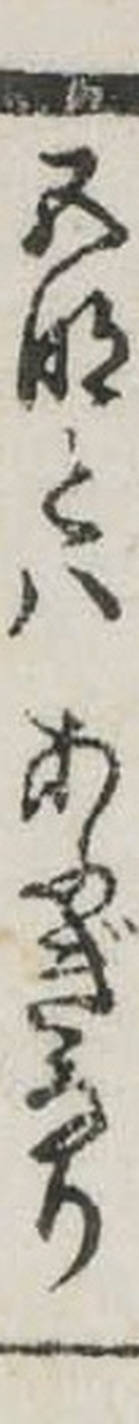五明とはあふぎなり
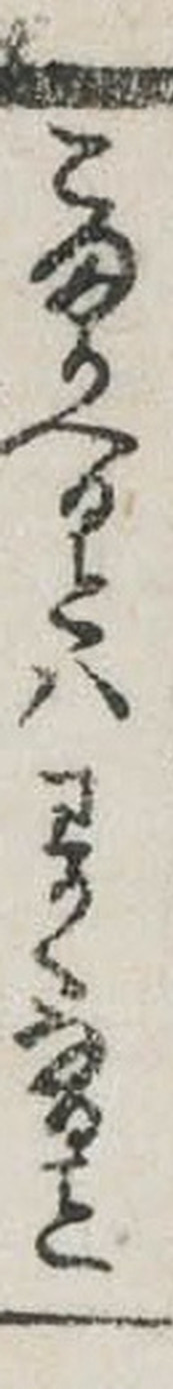こまかへるとはわかくなること
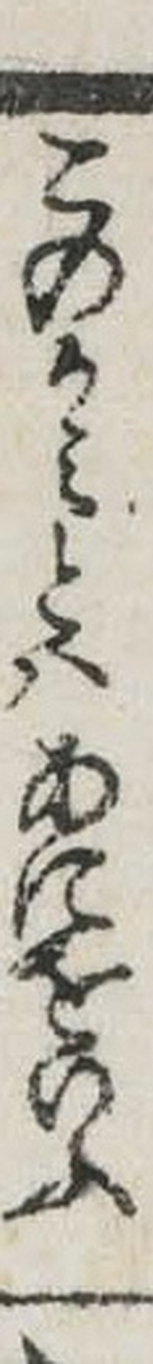このかみとはあにをいふ
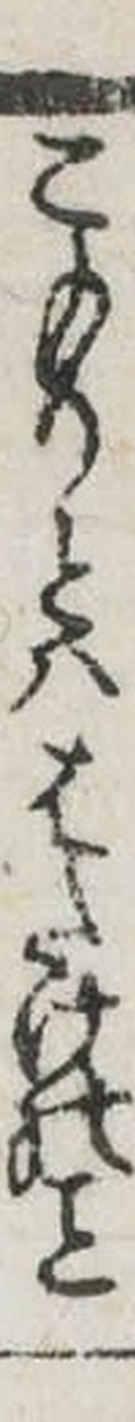こもりとははたけのこと
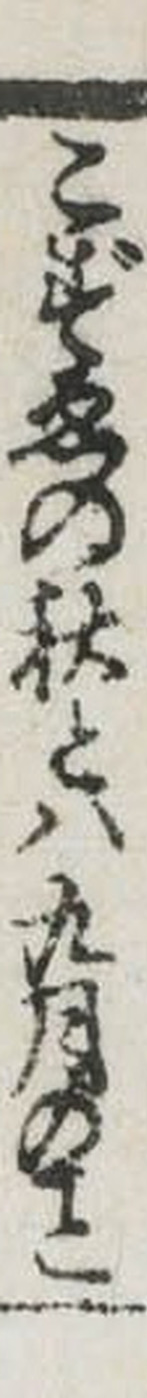こずゑの秋とは九月のこと
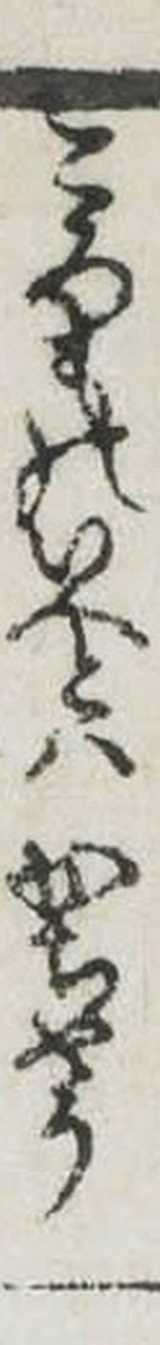ころものいへとはかちやう
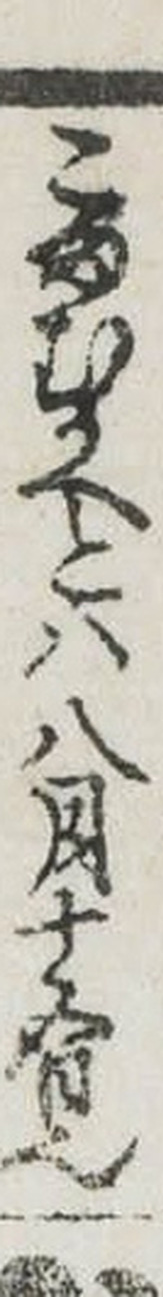こまむかへとは八月十五日也
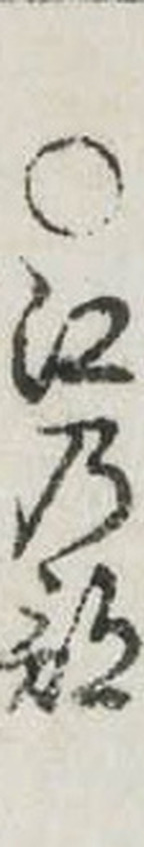○えの部
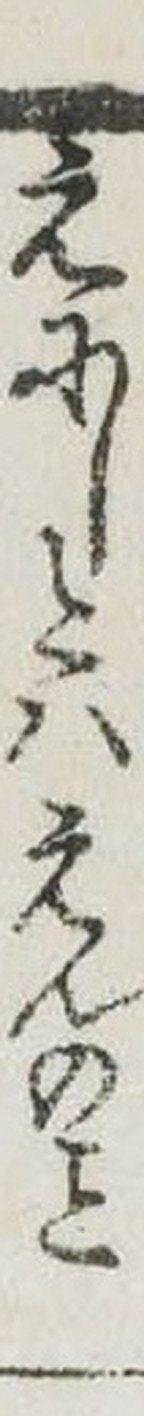えにしとはえんのこと
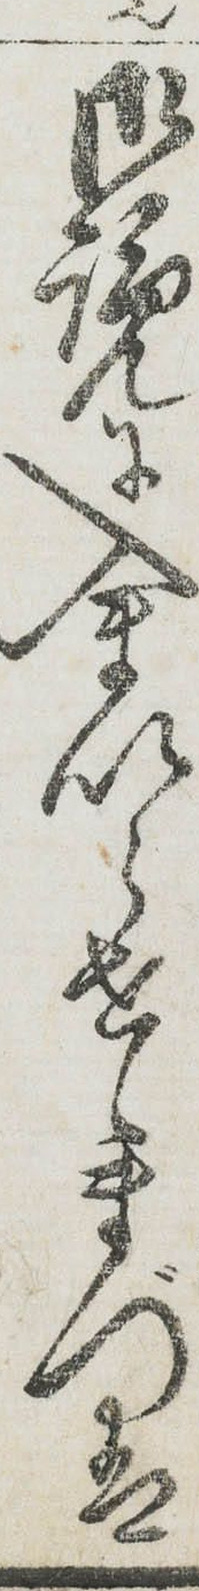御覧に入まいらせ候まづは
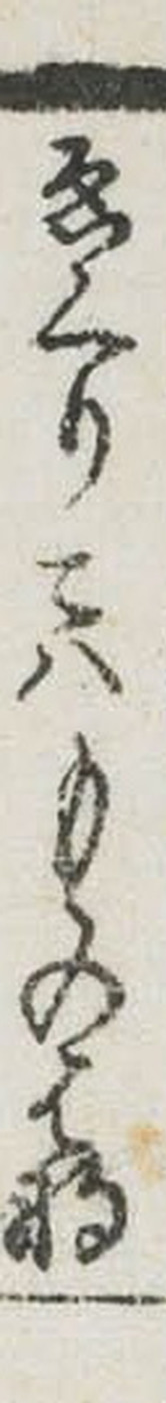ゑくりとはもゝのはな
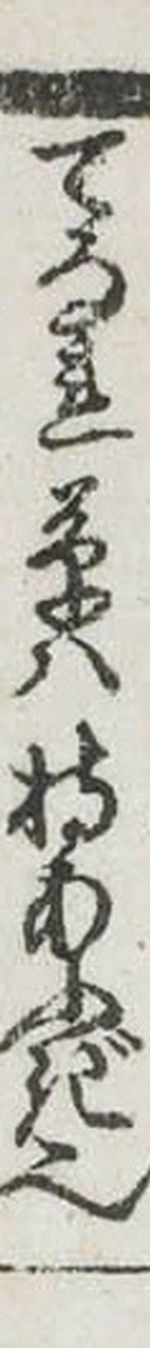てなれ草は持あふぎ也
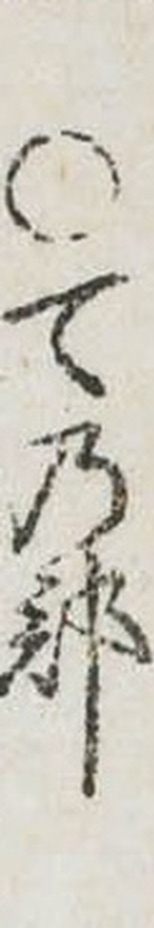○ての部
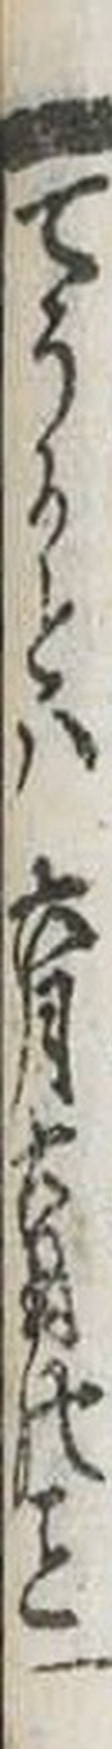てうろとは六月六日のこと
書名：頭書萬用婦人手紙之文言
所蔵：東京学芸大学教育コンテンツアーカイブ
